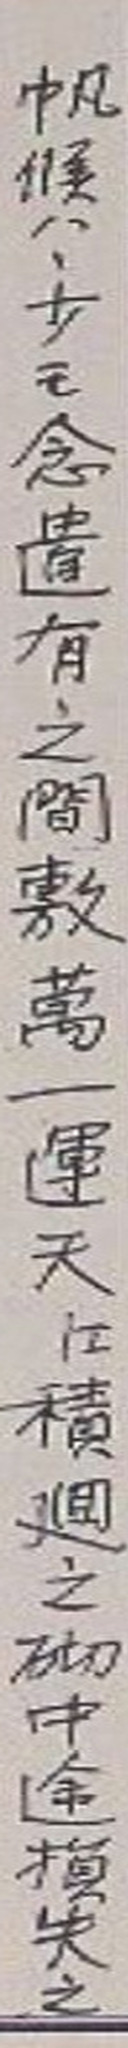帆候はゝ少も念遣有之間敷万一運天え積廻之砌中途損失之
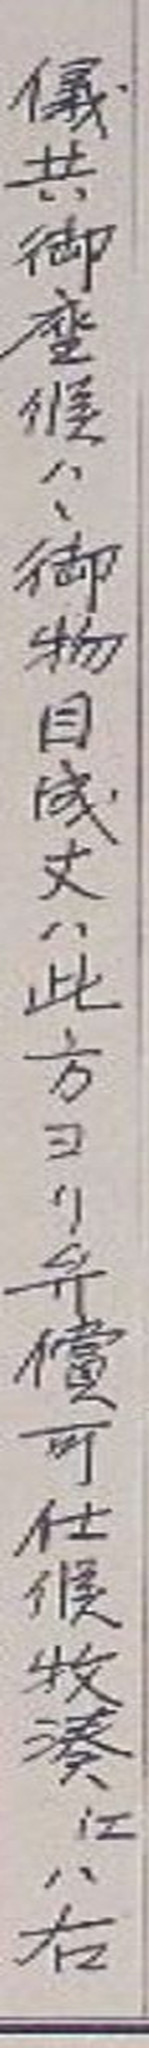儀共御座候はゝ御物目成丈は此方より弁償可仕候牧湊えは右
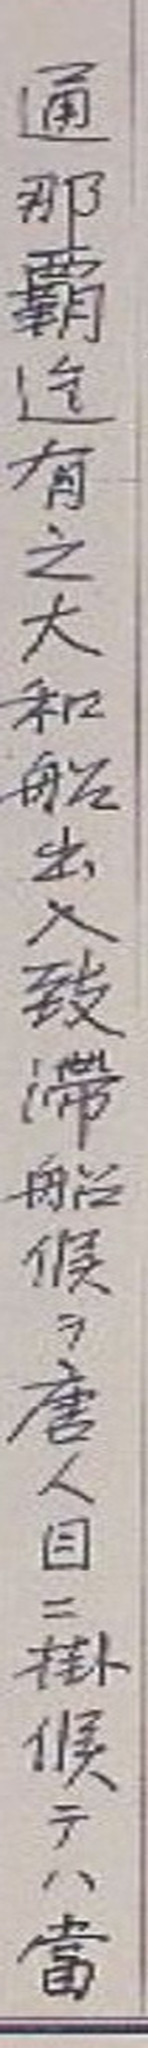通那覇迄有之大和船出入致滞船候を唐人目に掛候ては当
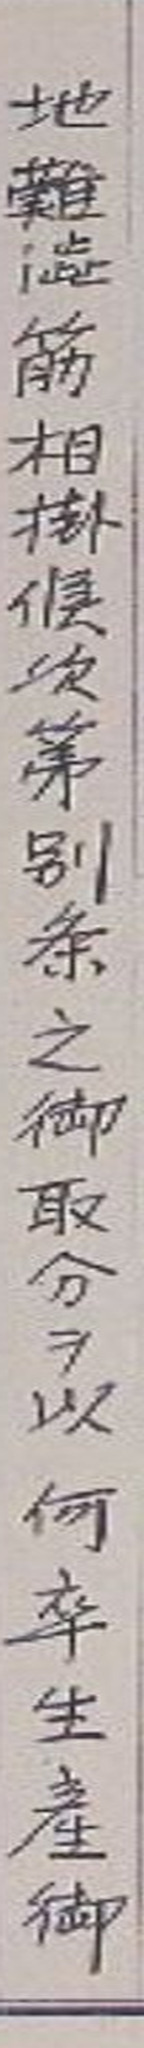地難渋筋相掛候次第別条之御取分を以何卒生産御

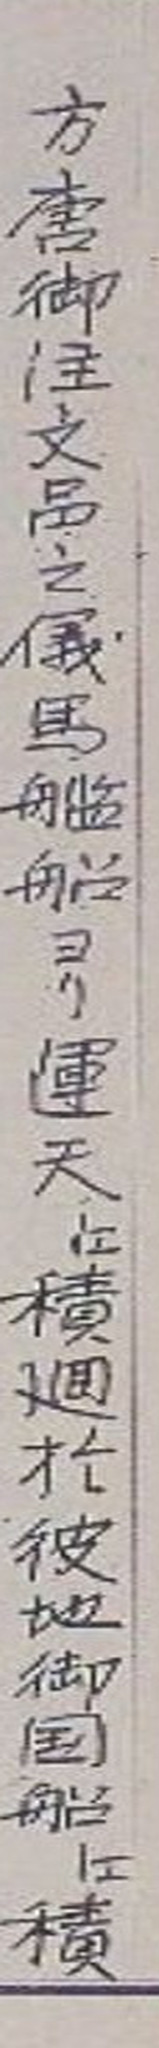方唐御注文品之儀馬艦船より運天え積廻於彼地御国船え積
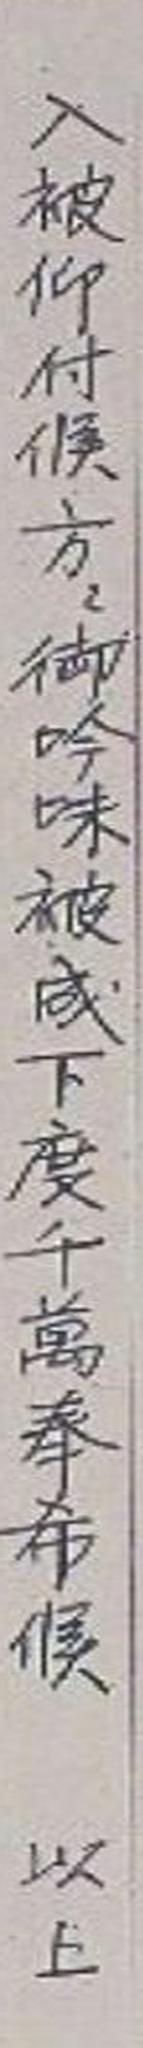入被仰付候方々御吟味被成下度千万奉希候以上
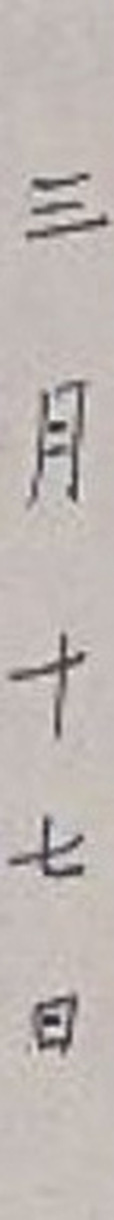三月十七日
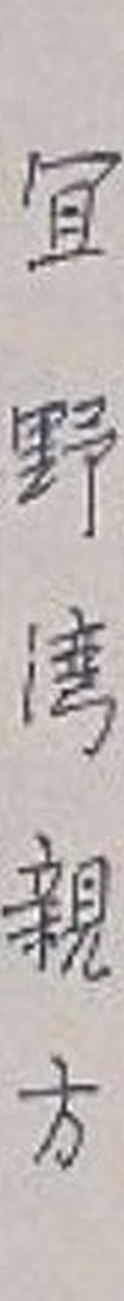宜野湾親方
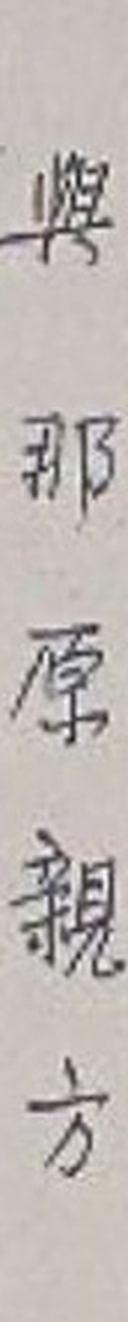与那原親方
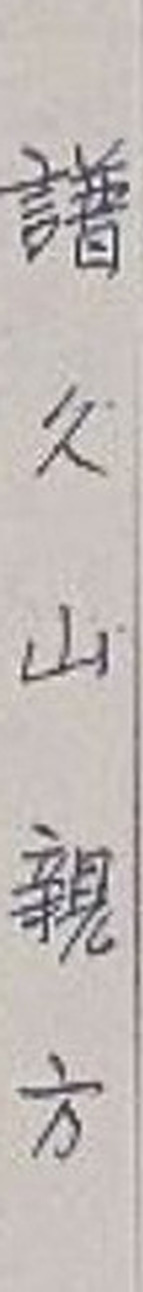譜久山親方
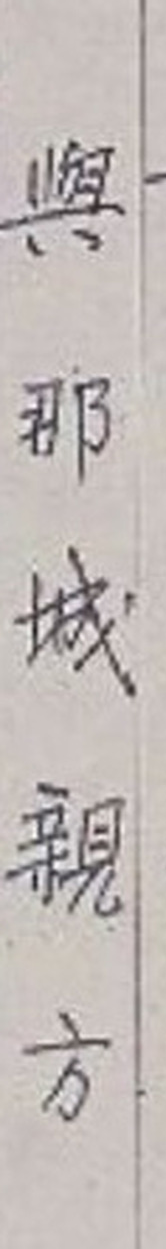与那城親方
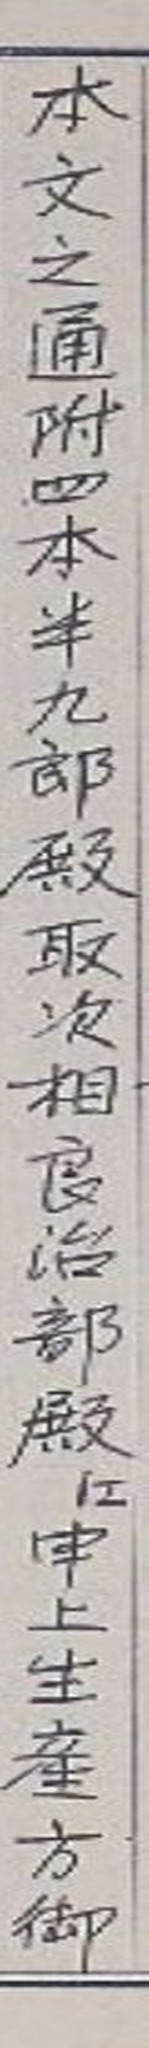本文之通附四本半九郎殿取次相良治部殿え申上生産方御
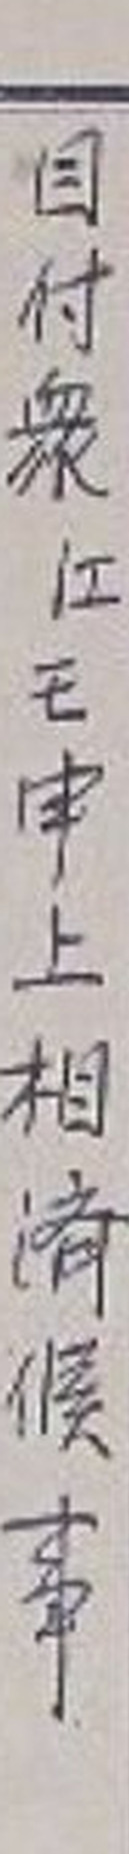目付衆えも申上相済候事
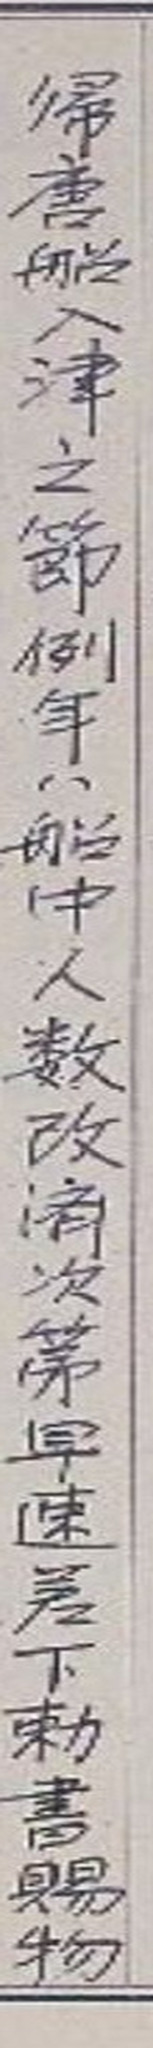帰唐船入津之節例年は船中人数改済次第早速差下勅書賜物
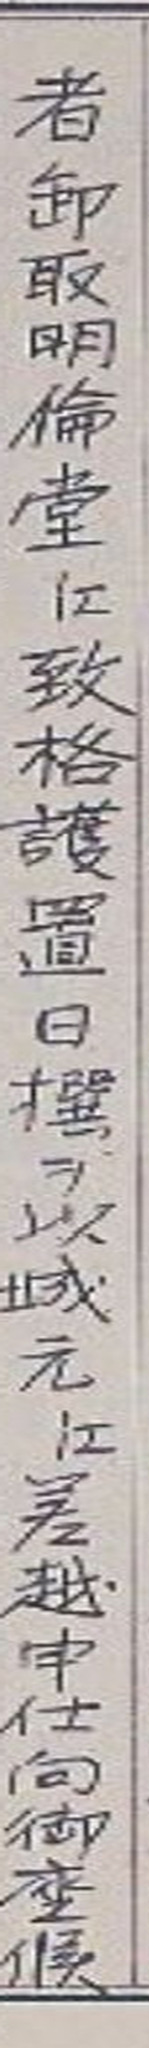者卸取明倫堂え致格護置日撰を以城元え差越申仕向御座候
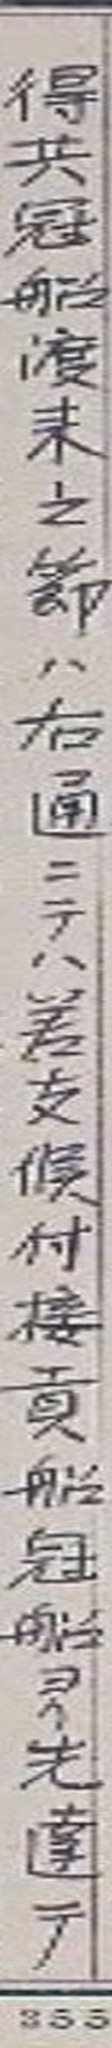得共冠船渡来之節は右通にては差支候付接貢船冠船より先達て
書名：支那冊封使来琉諸記 下巻
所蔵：University of the Ryukyus Library
